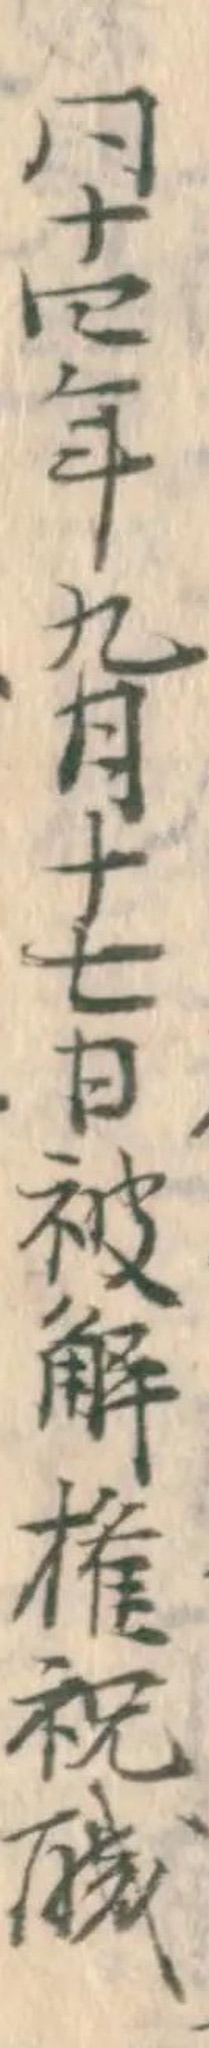同十四年九月十七日被解権祝職
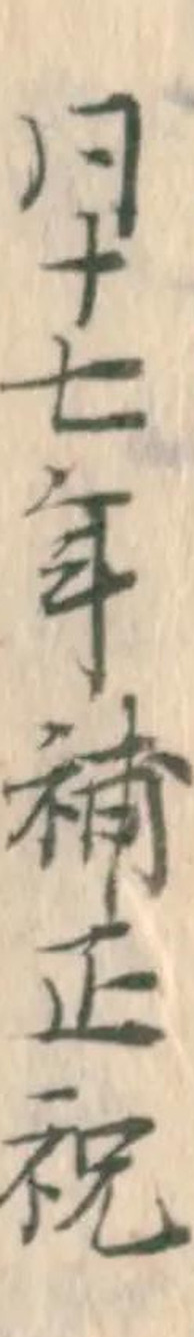同十七年補正祝
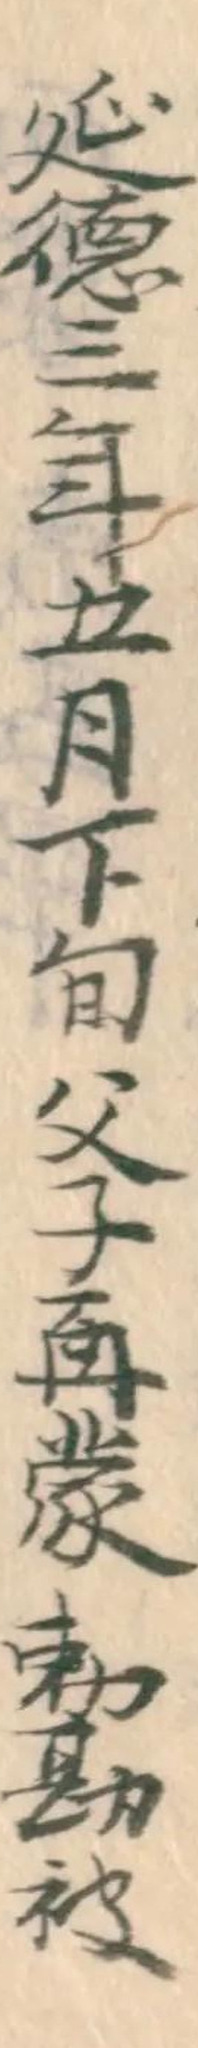延徳三年五月下旬父子再蒙勅勘被
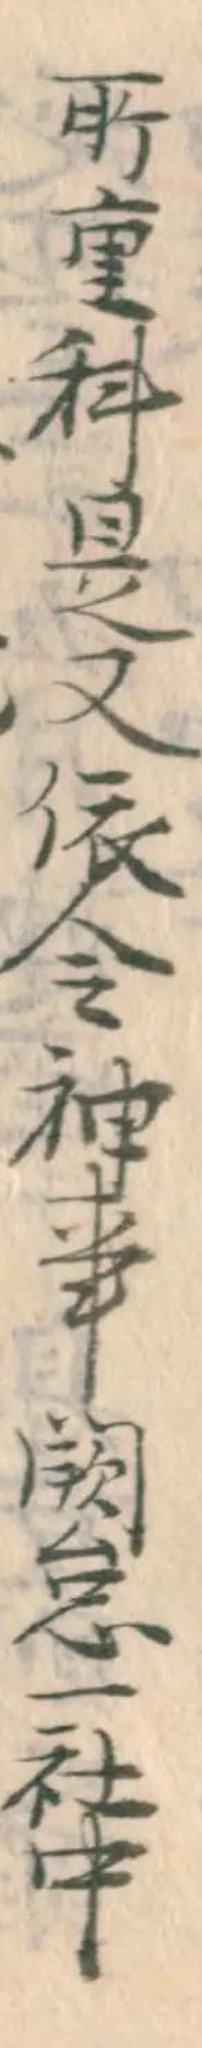所重科是又依令神事闕怠一社中
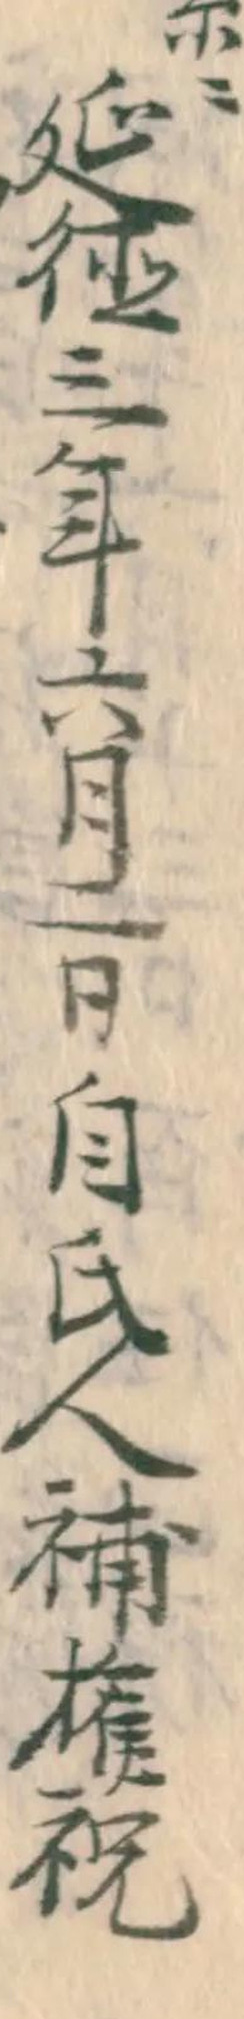重秋延徳三年六月二日自氏人補権祝
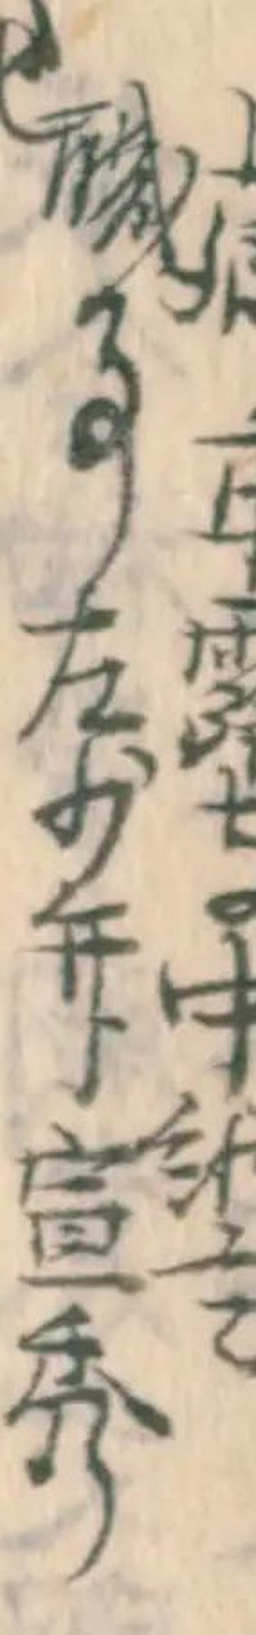職事左少弁宣秀
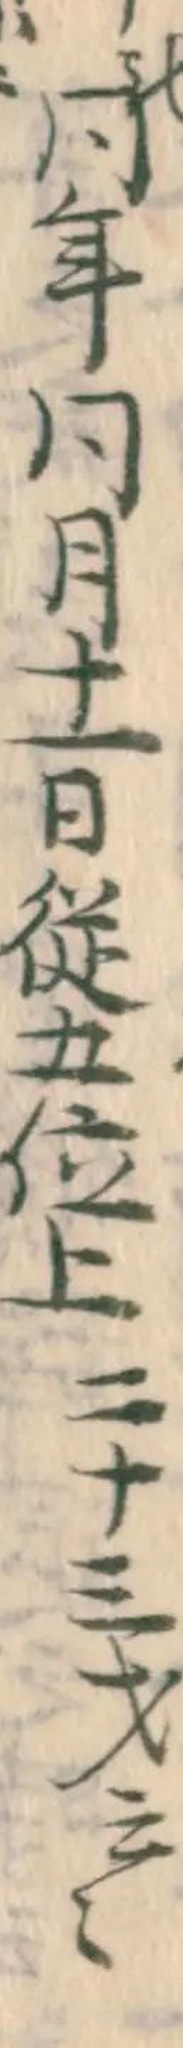同年同月十一日従五位上二十三才云々
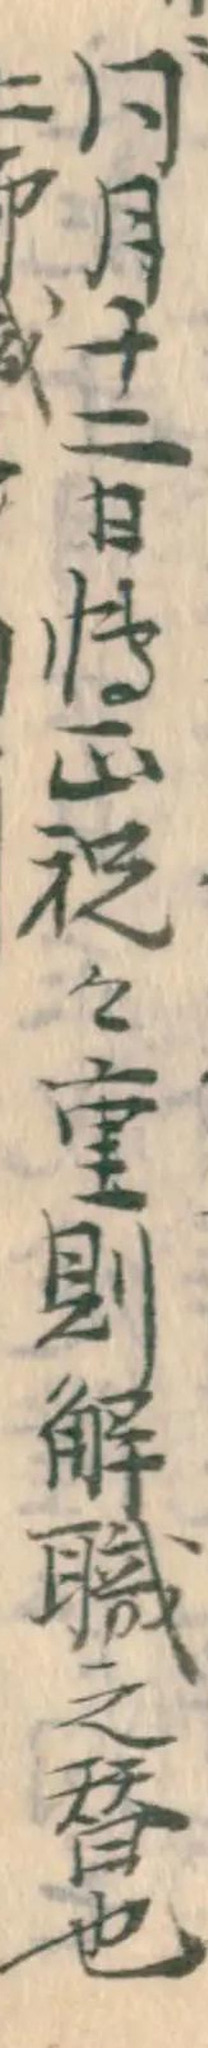同月十二日転正祝々重則解職之替也
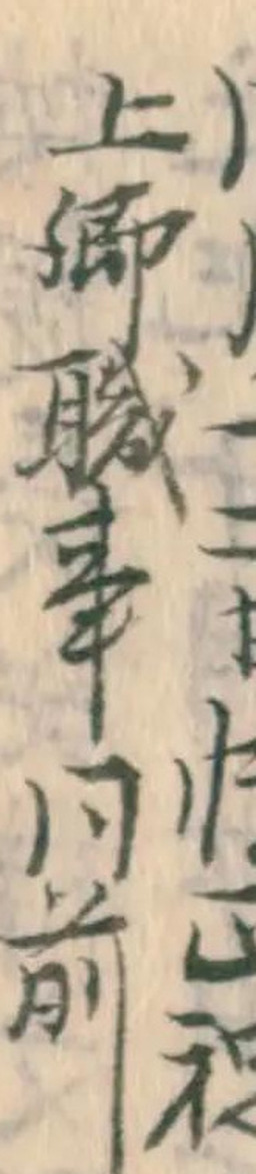上卿職事同前
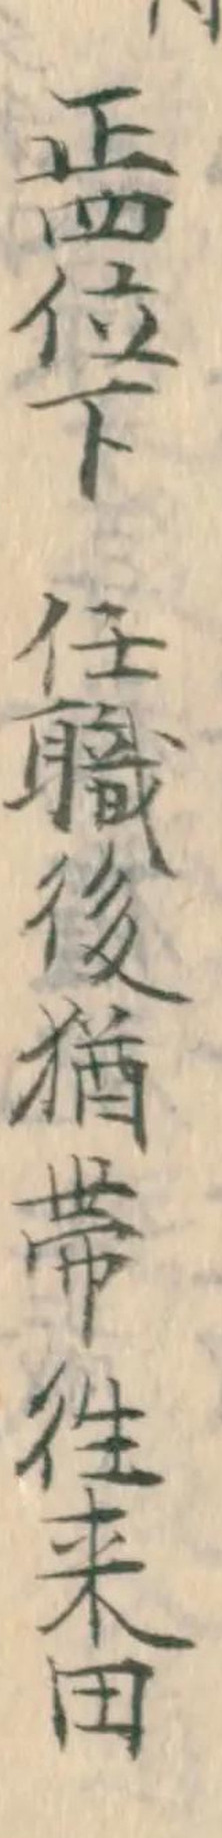正四位下任職後猶帯往来田
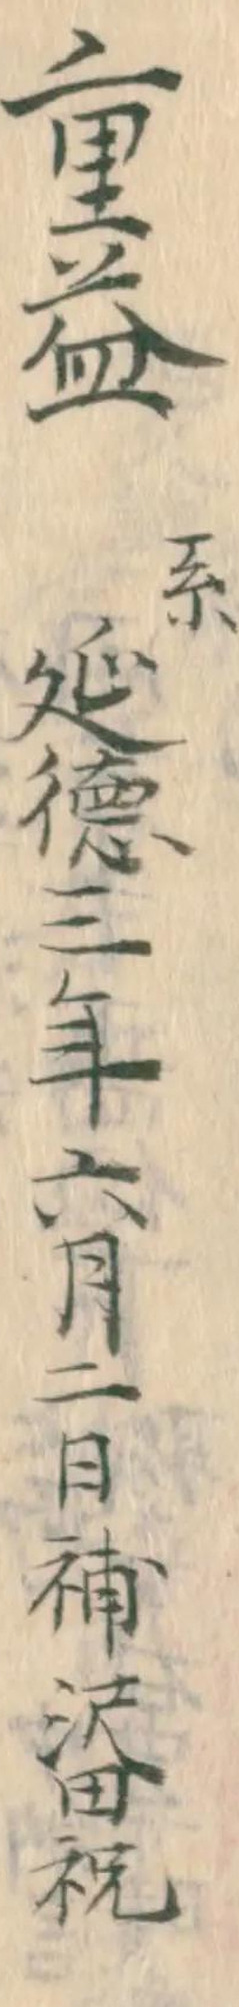重益延徳三年六月二日補沢田祝
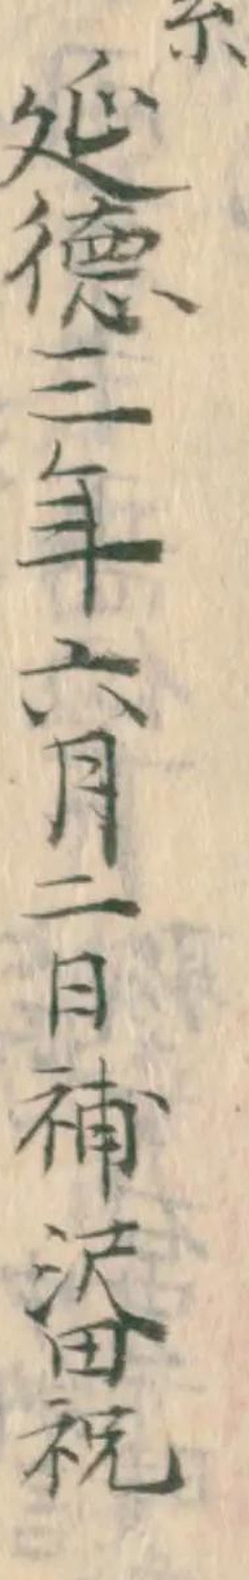重益延徳三年六月二日補沢田祝
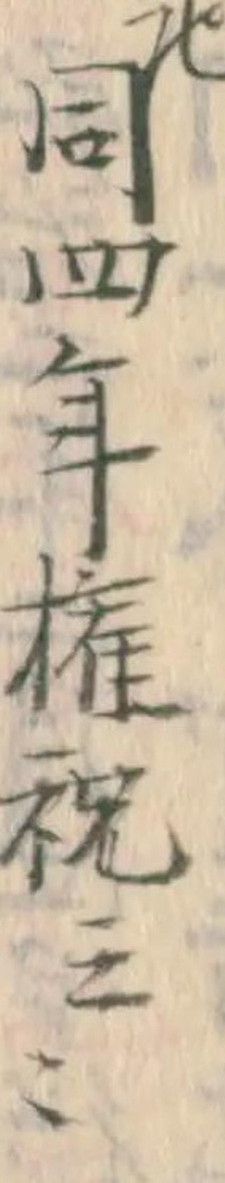同四年権祝云々
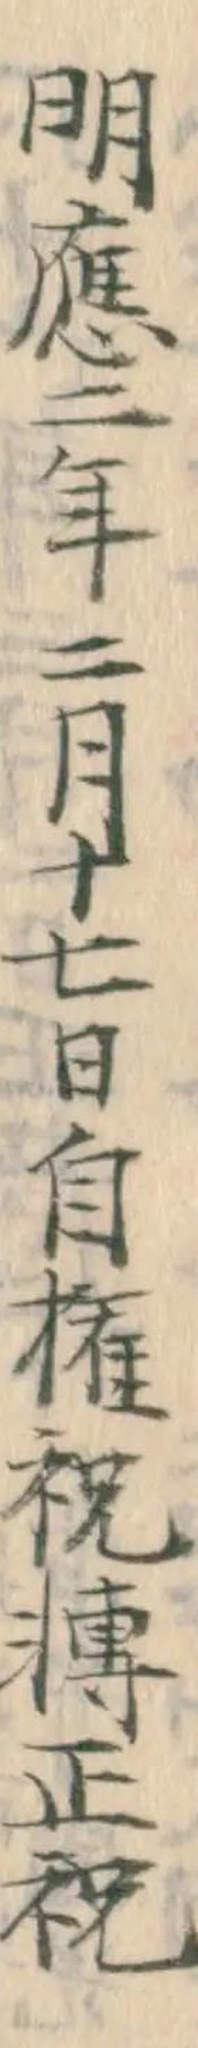明応二年二月十七日自権祝転正祝
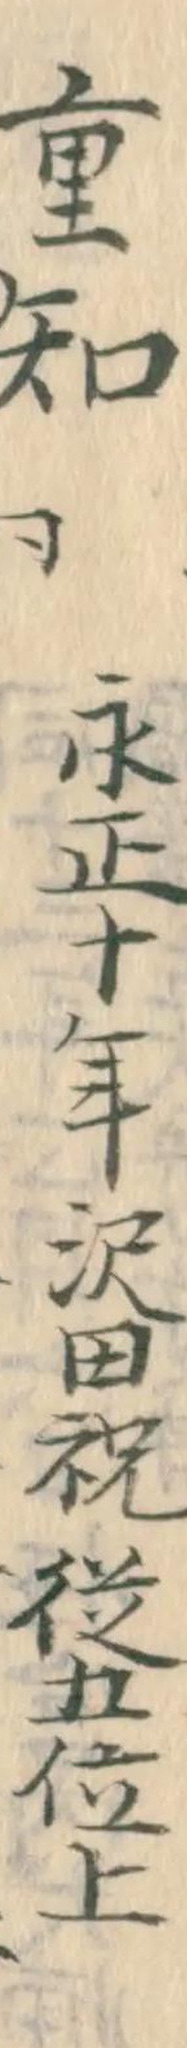重知永正十年沢田祝従五位上
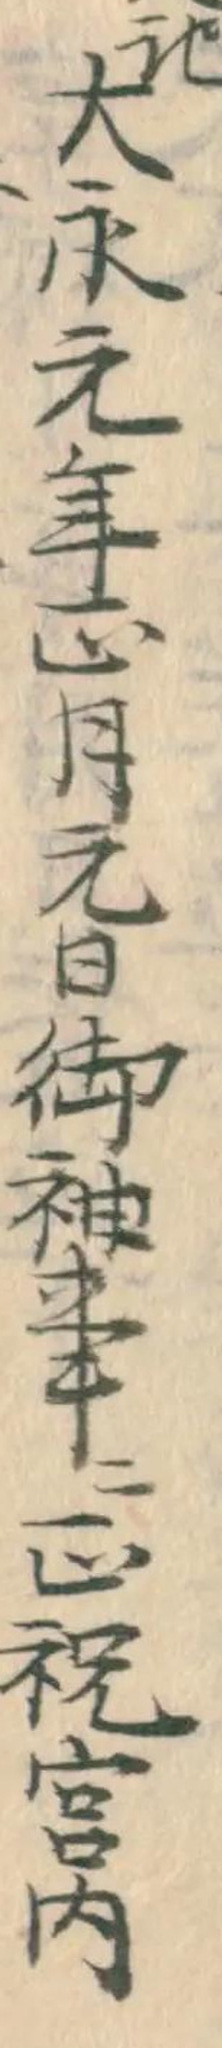大永元年正月元日御神事ニ正祝宮内
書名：賀茂社記録. 第23冊
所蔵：国立国会図書館 National Diet Library, JAPAN
